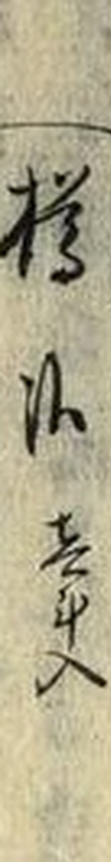樽弐壱升入
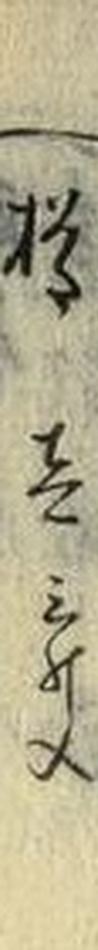樽壱三升入
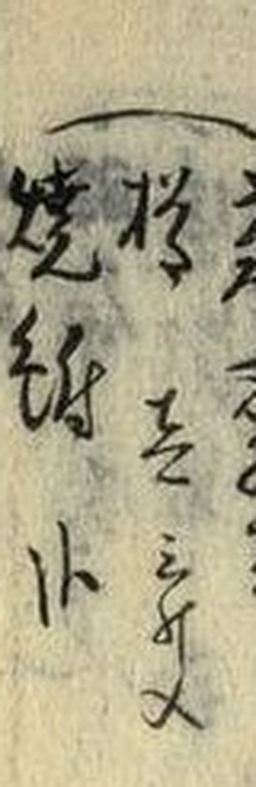焼鮒弐
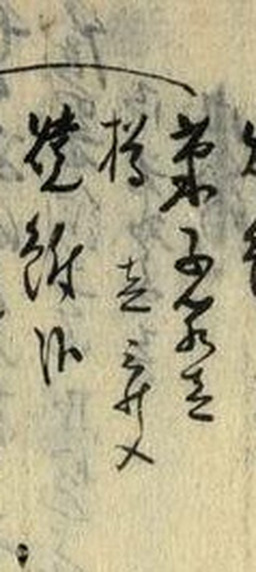樽壱三升入
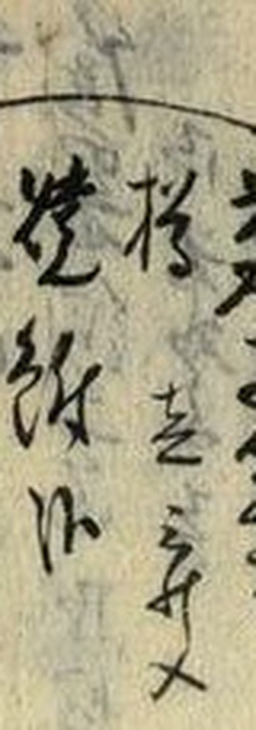焼鮒弐
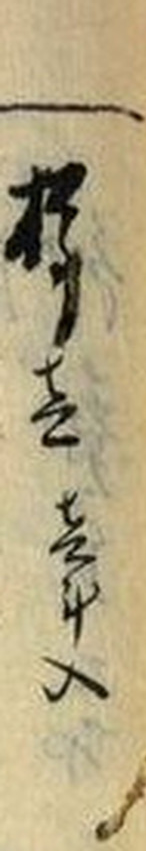樽壱壱升入
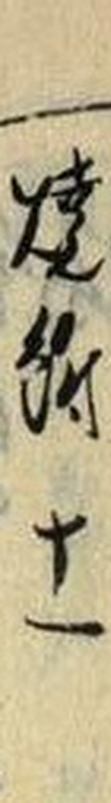焼鮒十一
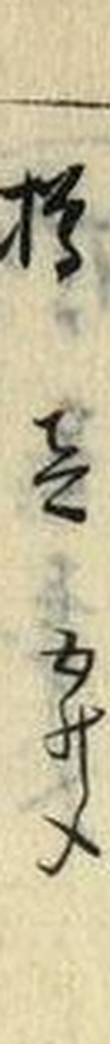樽壱五升入
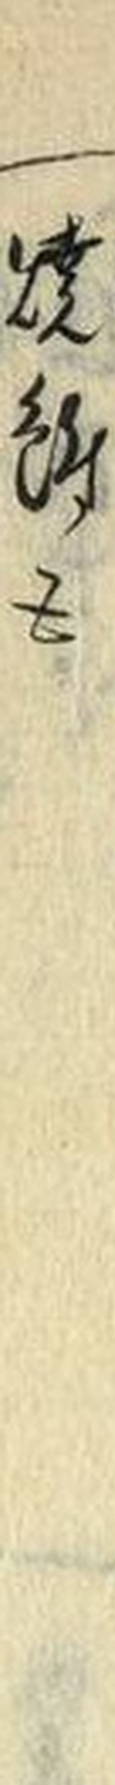焼鮒五
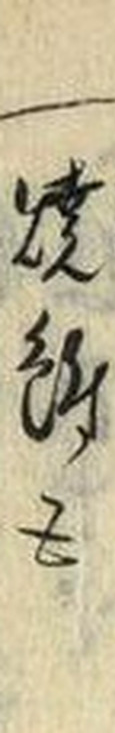焼鮒五
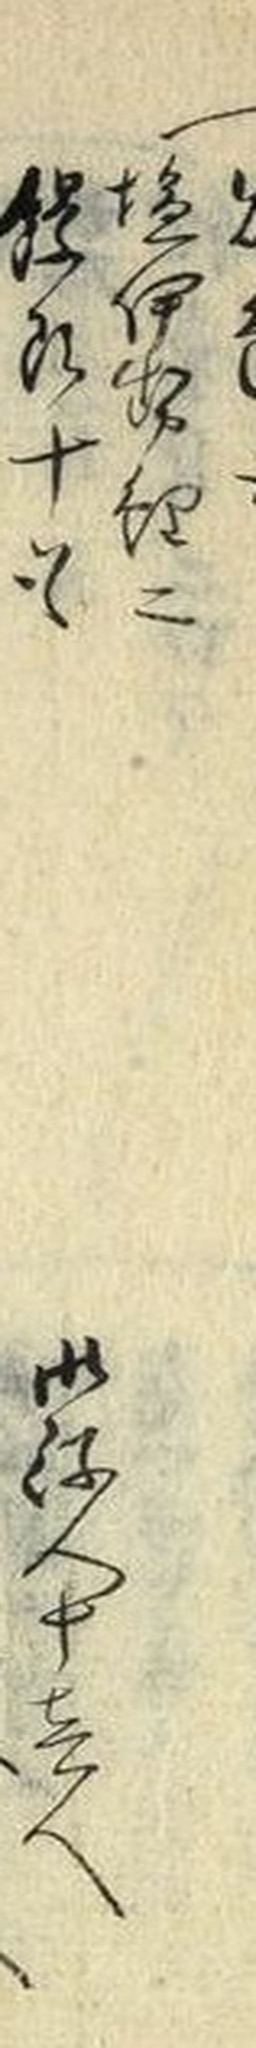饅頭十ツヽ御役人十壱人
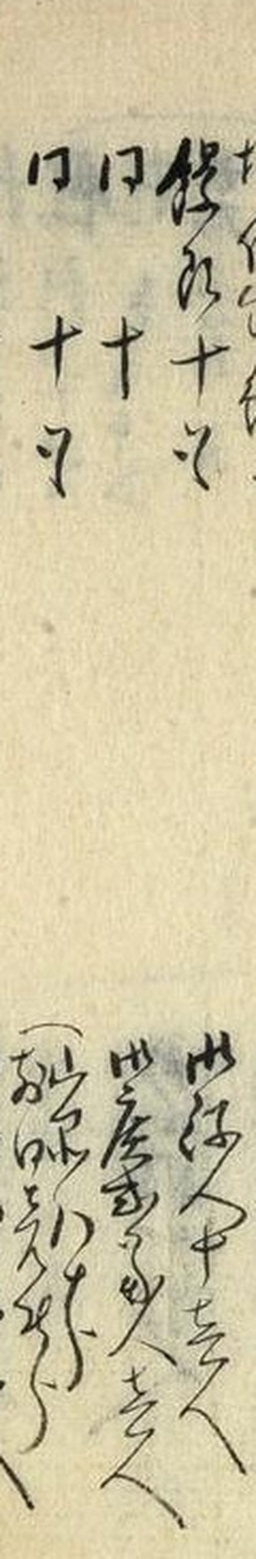同十御広式御用人壱人
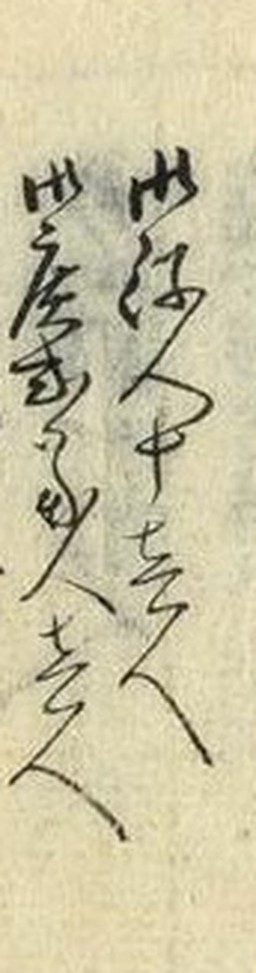同十御広式御用人壱人
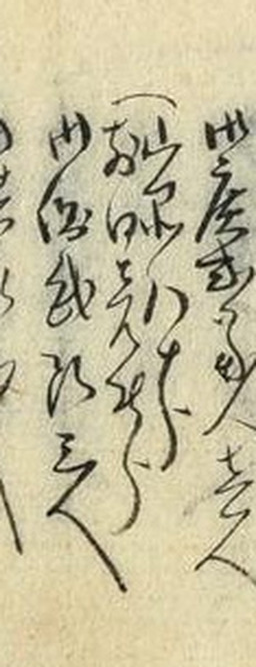前田彦次郎
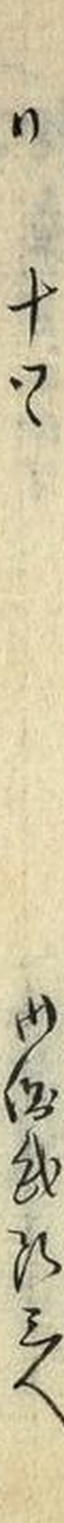同十ツヽ御側武頭三人
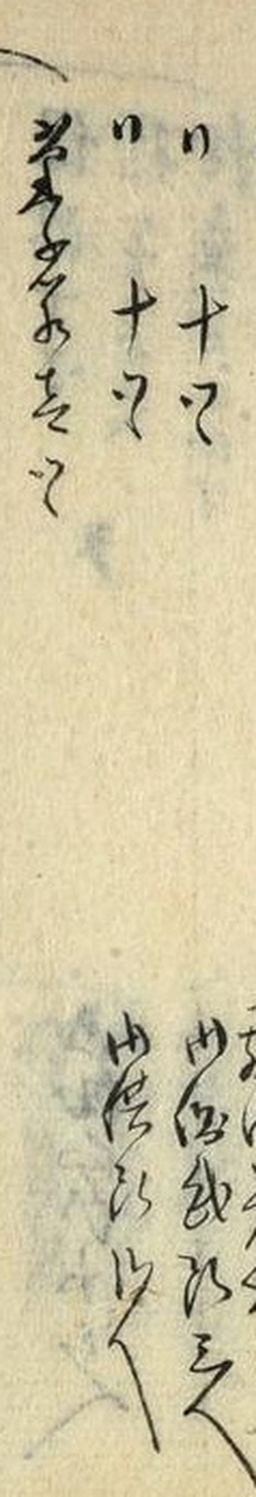同十ツヽ御供頭弐人
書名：少傅日録抄（斉承付側向頭取日記、在国）
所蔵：福井県文書館 Fukui Prefectural Archives
